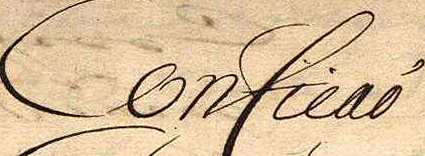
Confiçaõ
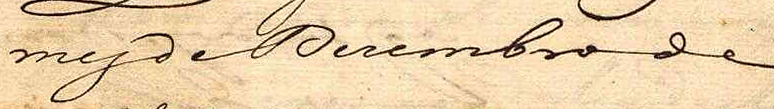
mes de Dezembro de
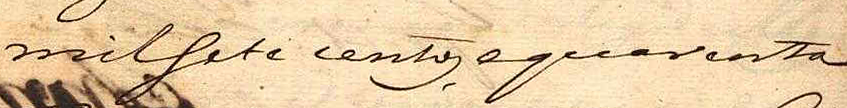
mil setecentos e quarenta
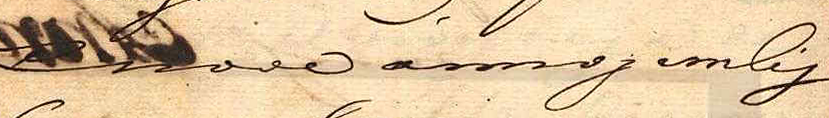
e nove annos em lis
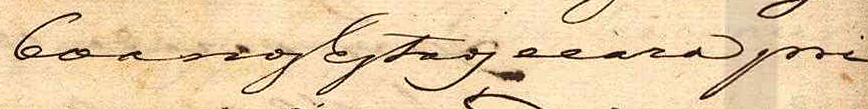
boa nos Estaos e caza pri
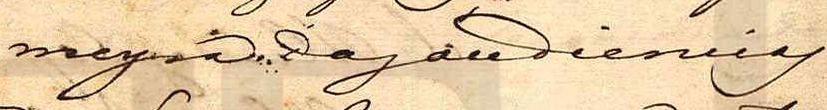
meyra das audiencias
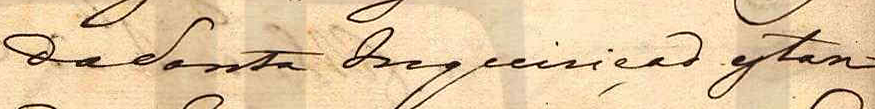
da Santa Inquiziçaõ estan
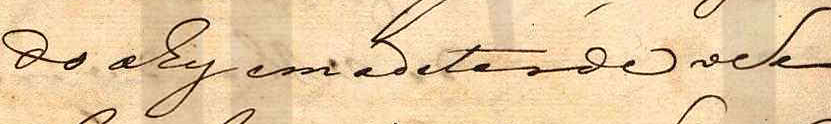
do ahy em a de tarde o Se
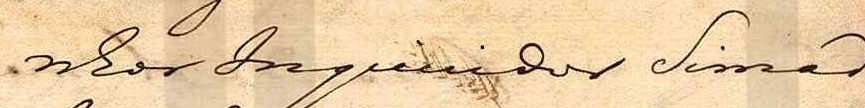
nhor Inquizidor Simaõ
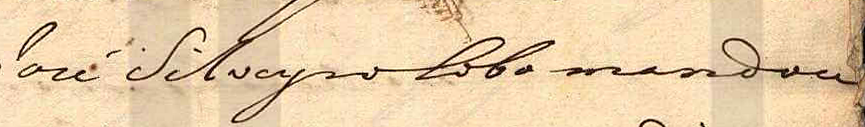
Iozé Silveyro Lobo mandou
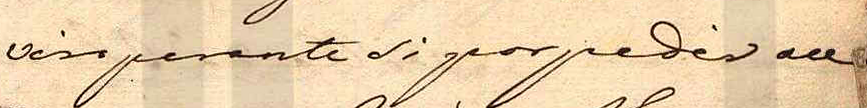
vir perante si por pedir au
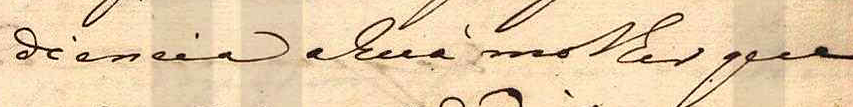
diencia a huā molher que
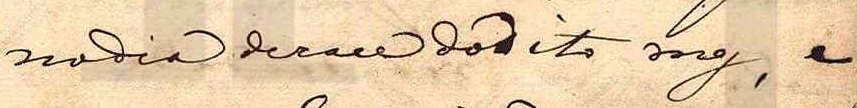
no dia dezace do dito mes, e
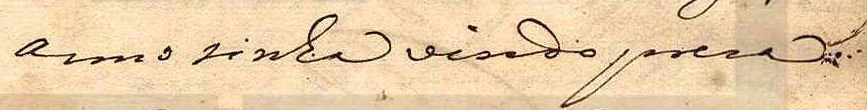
como tinha vindo preza
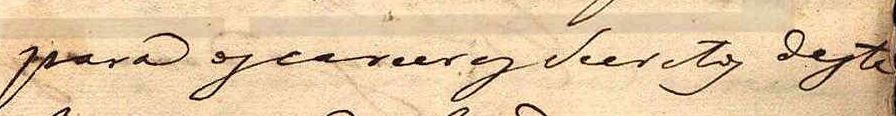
para os carceres secretos deste
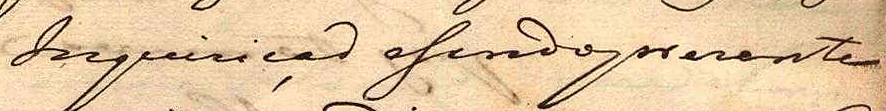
Inquiziçaõ e sendo prezente
